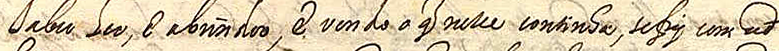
Saber Ler, e abrindoo, e vendo o q̄ nelle continha, se foy com a d̄
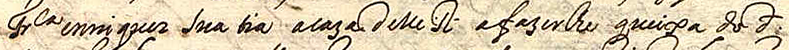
Frca enrriquez sua tia a caza delle R. a fazerlhe queixa do d̄
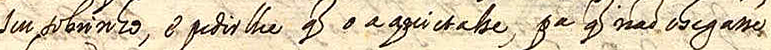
seu sobrinho, e pedirlhe q̄ o aquietasse, pa q̄ não chegassē
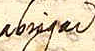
a brigar
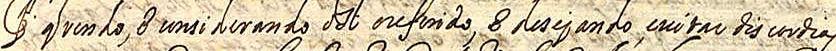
P. vendo, e considerando o R o referido, e desejando euitar discordias
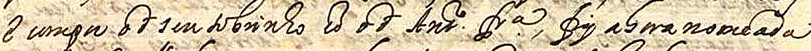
e compor o d̄ seu sobrinho cō o d̄ Anto. fra., foy a hora nomeada
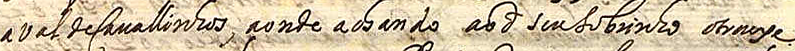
a val de Cauallinhos, aonde achando ao d̄ seu Sobrinho o trouxe
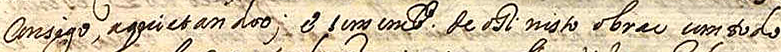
consigo, aquietandoo; e sem embo. de o R. nisto obrar com todo
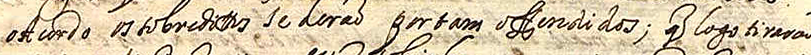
o Acordo os sobredittos se derão por tam offendidos; q̄ logo tiraraõ
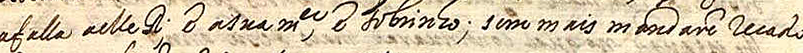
a falla a elle R; e a sua mer, e sobrinho; sem mais mandarē Recado
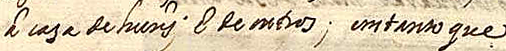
â caza de huns̄; e de outros; em tanto que
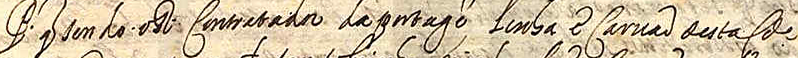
P. q̄ sendo o R. Contratador da portagē, Lenha e Caruaõ desta Cde.
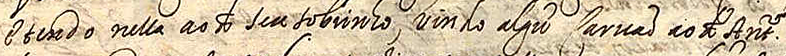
e tendo nella ao d̄ seu sobrinho, vindo algū Caruaõ ao d̄ Anto.
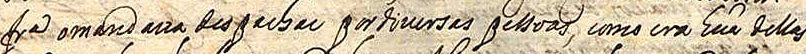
fra o mandaua despachar por diuersas pessoas, como era huā dellas
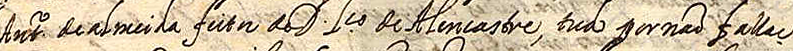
Anto. de almeida feitor de D. L.co de Alencastre, tudo por não fallar
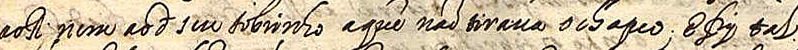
ao R; nem ao d̄ seu sobrinho a quē nãoaõ tiraua o chapeo; e foy taL
